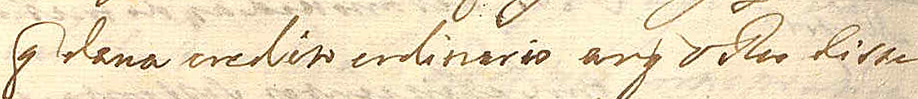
q̄ daua credito ordinario ao q̄ o Reo disse
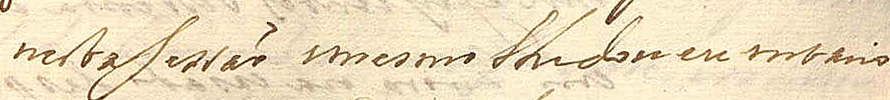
nesta Sessaõ o mesmo lhe dou eu notario
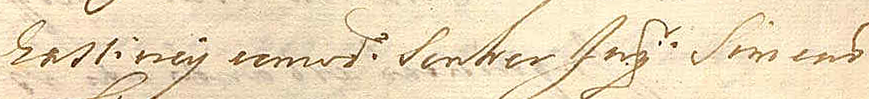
E assiney com o d.o Senhor Jnqr. Simeaõ
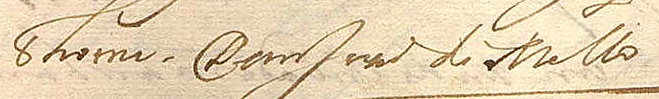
Thome. Dom Joaõ de Mello
